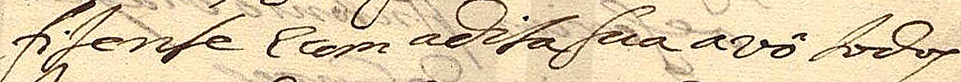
fitente e com a dita sua avô todos
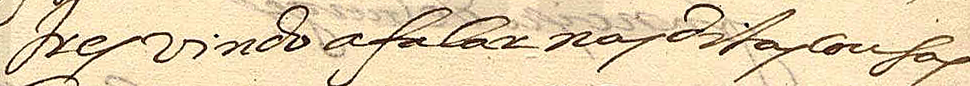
tres vindo a falar nas ditas cousas
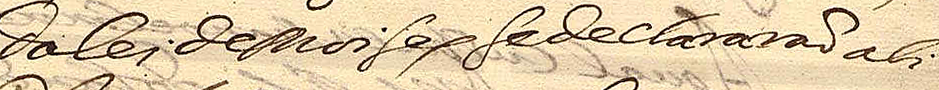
da lei de Moises se declararaõ ali
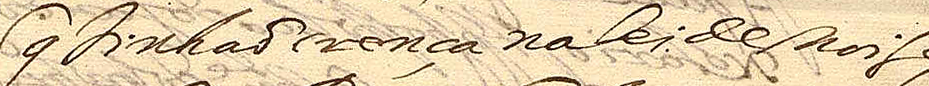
q̄ tinhaõ crença na lei de Moises
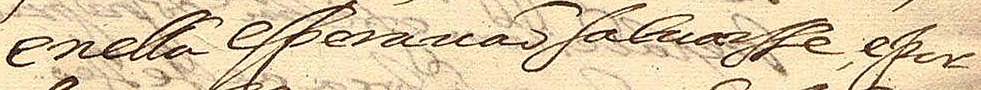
e nella esperauaõ saluarsse, e por
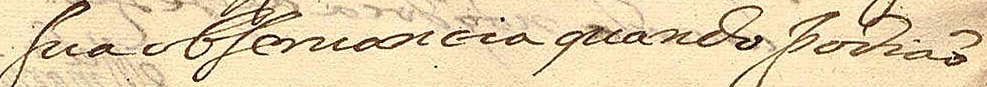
sua obseruancia quando podiaõ
